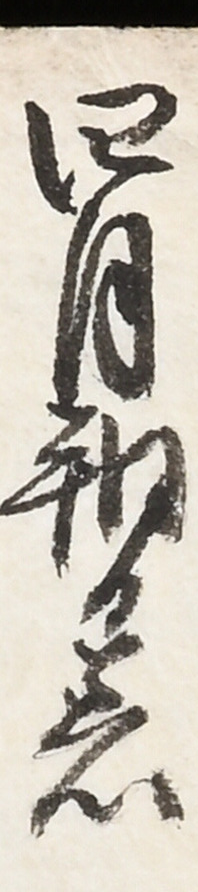四月朔日着
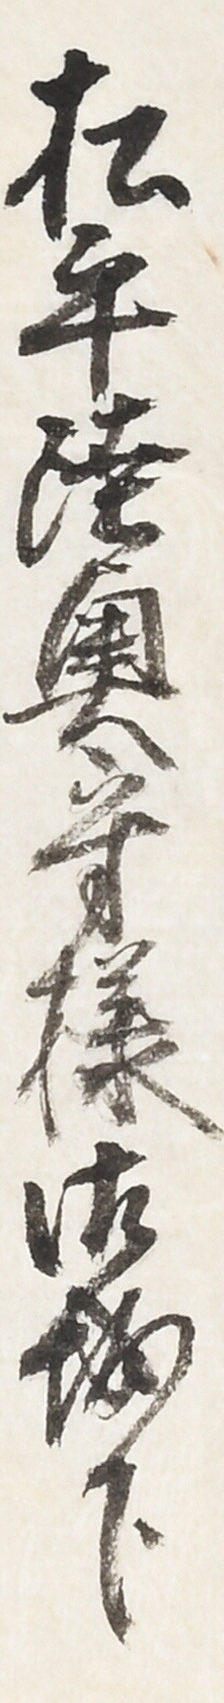松平陸奥守様御城下
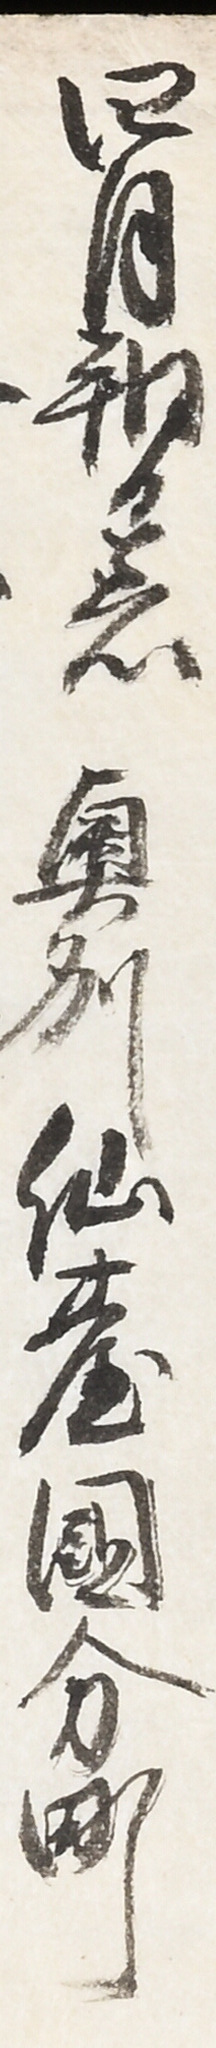四月朔日着奥州仙台国分町
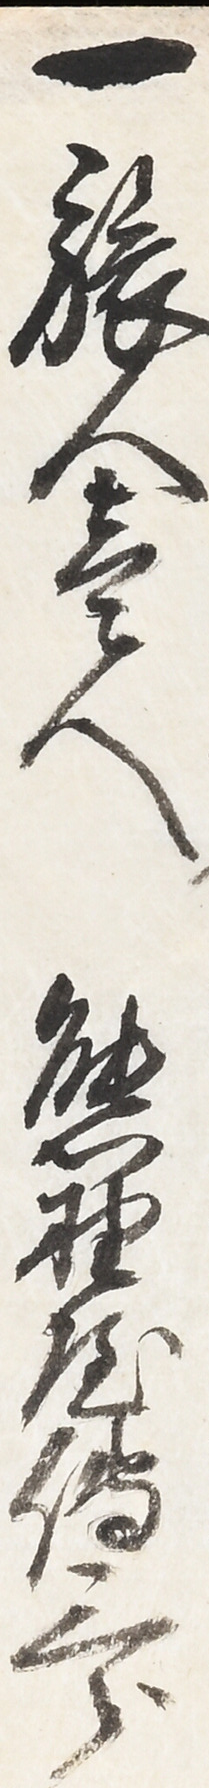一旅人壱人熊野屋伝三郎
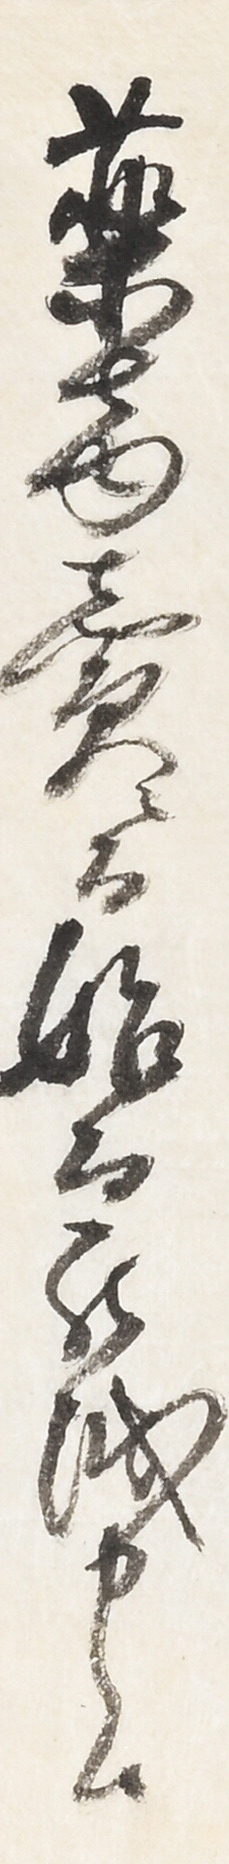薬商売ニ而始而罷越申候
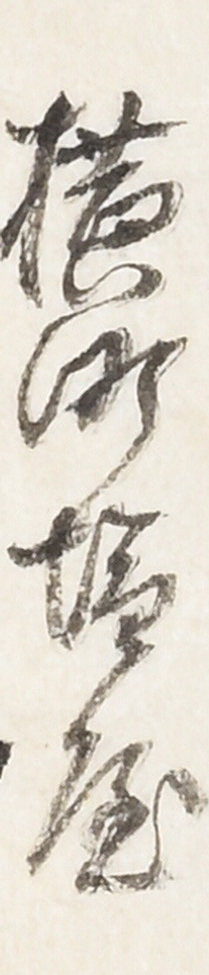横町塩屋
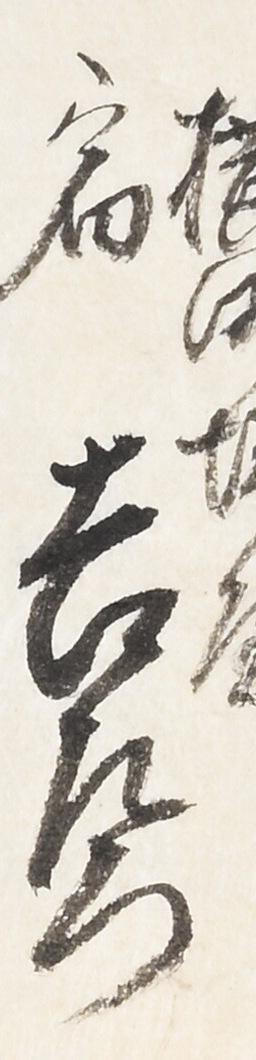宿吉左衛門
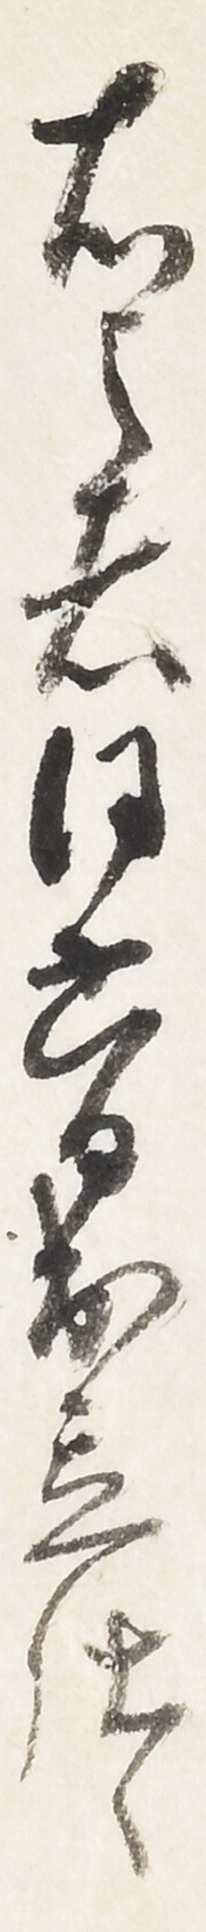右之者同六日出立仕候
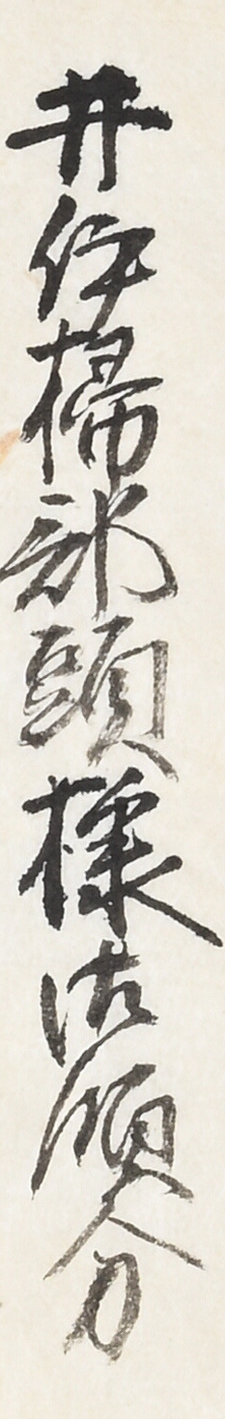井伊掃部頭様御領分
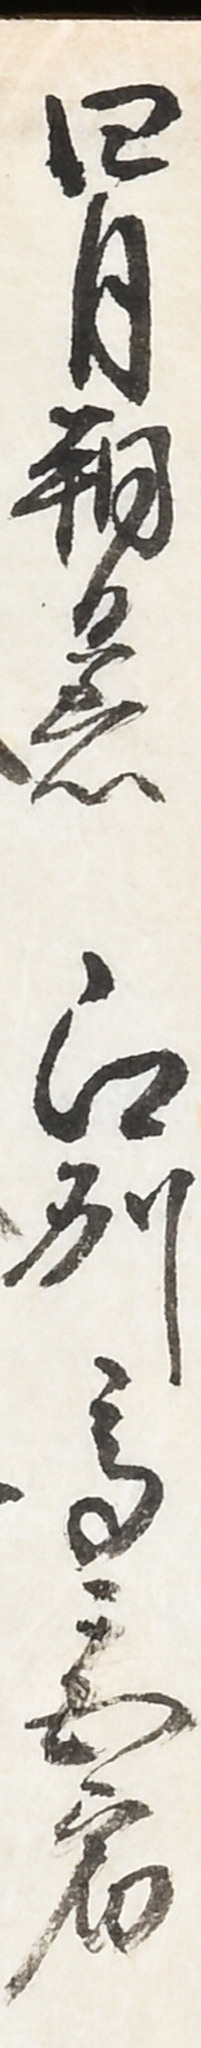四月朔日着江州高宮宿
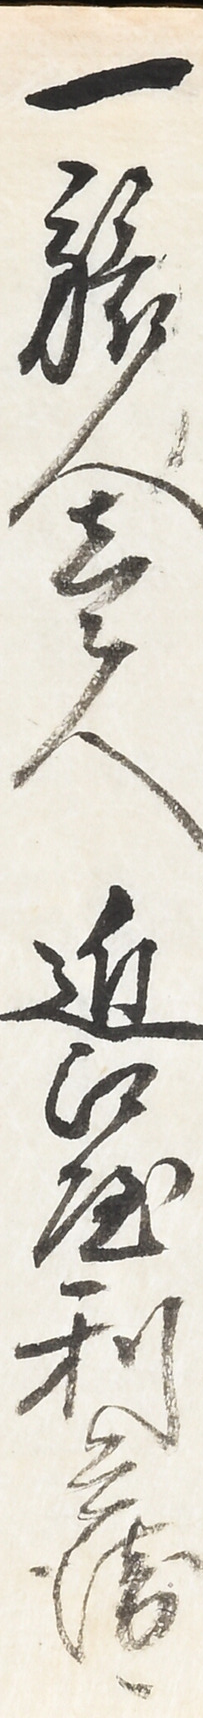一旅人壱人近江屋利兵衛・
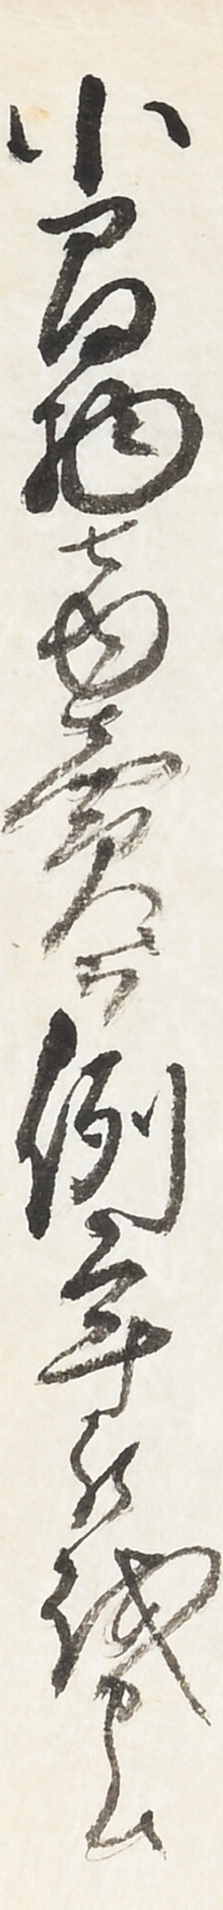小間物商売ニ而例年罷越申候
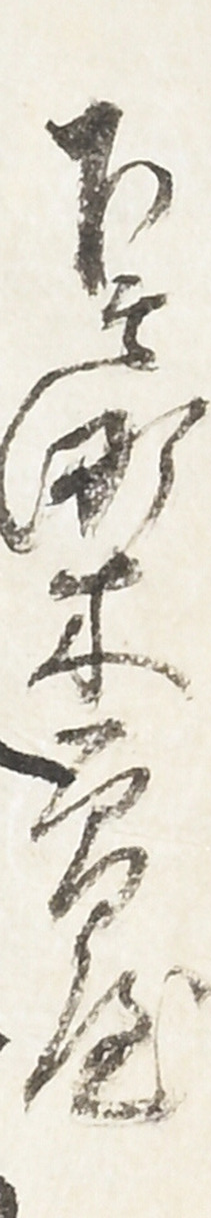下モ町木曽屋
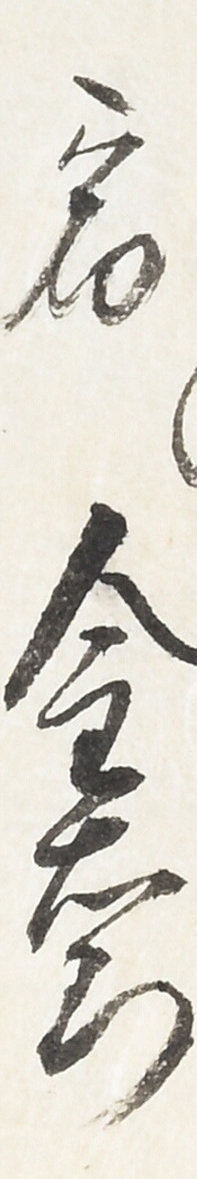宿金右衛門
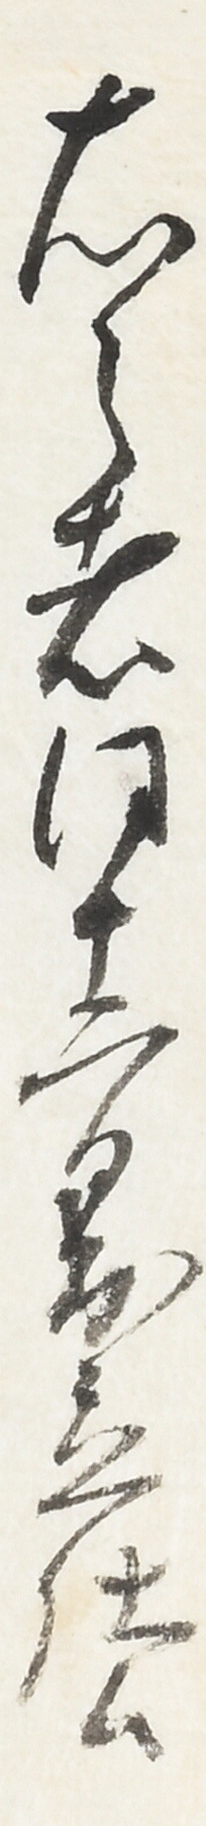右之者同十二日出立仕候
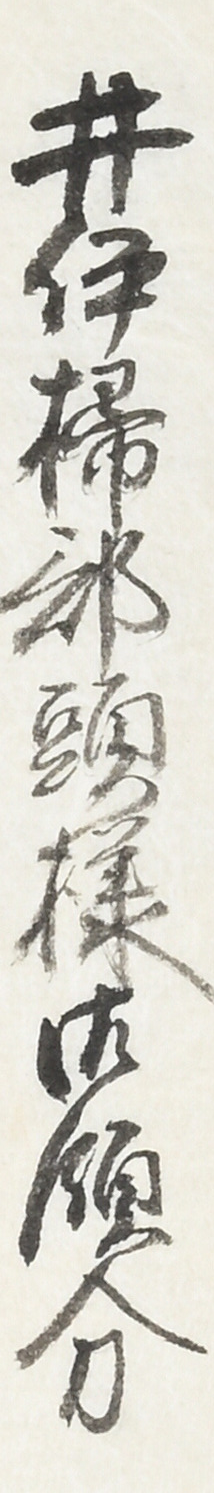井伊掃部頭様御領分
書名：旅人泊控帳
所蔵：伊那市立高遠町図書館・合同会社AMANE
